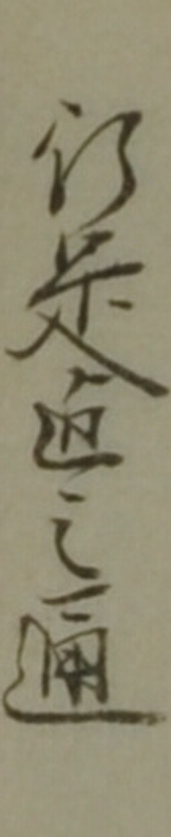行是迄之通
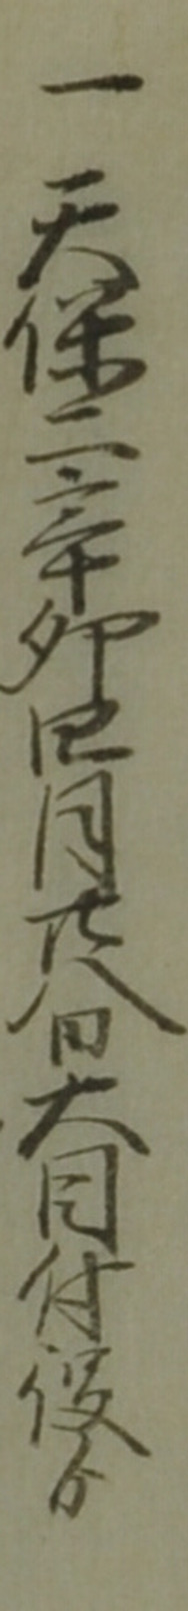一天保二辛卯四月廿八日大目付役ゟ
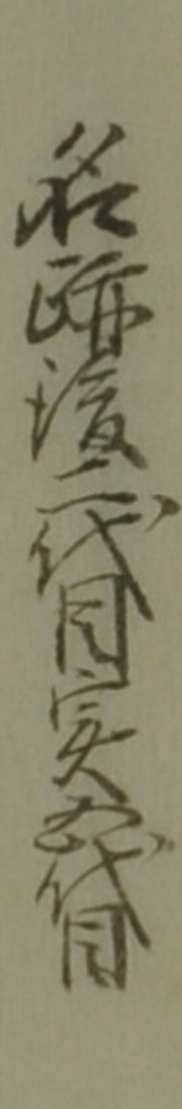名跡後二代目実五代目
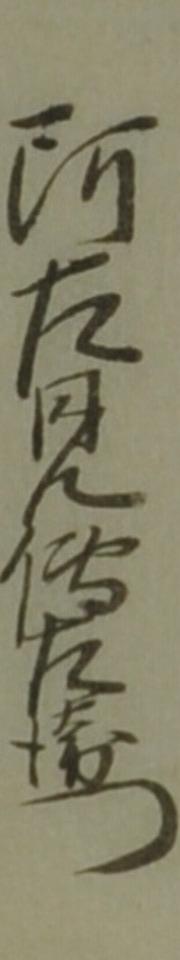阿左見伝左衛門
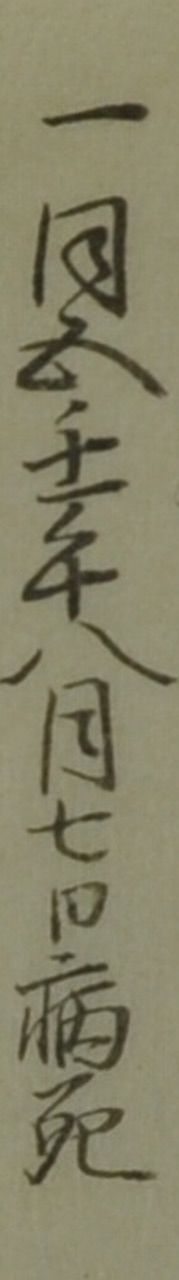一同五壬午八月七日病死
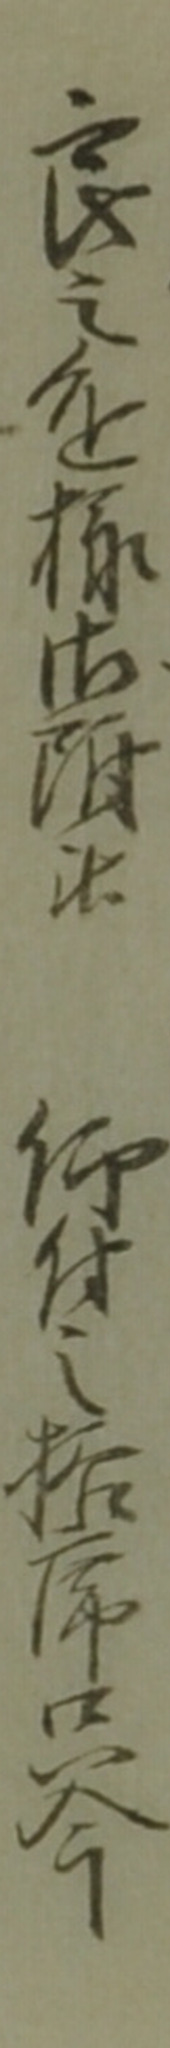良之進様御附被仰付之格席只今
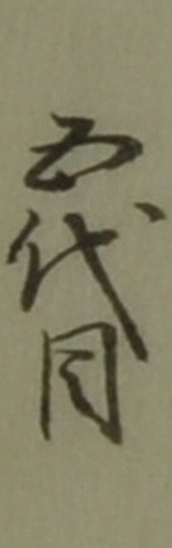五代目
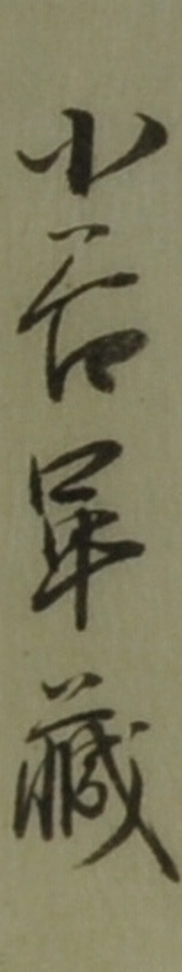小谷軍蔵
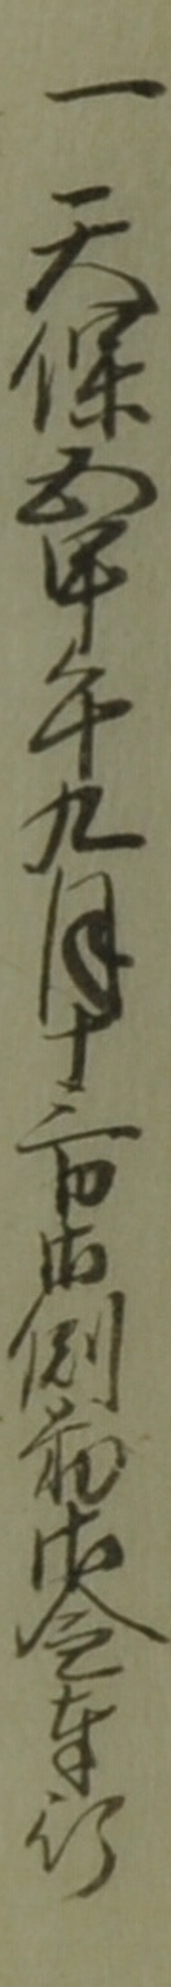一天保五甲午九月十三日御側勤御金奉行
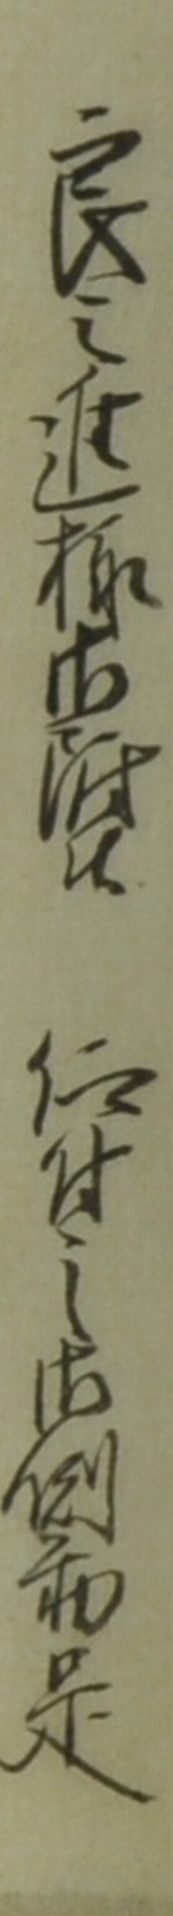良之進様御附被仰付之御側勤是
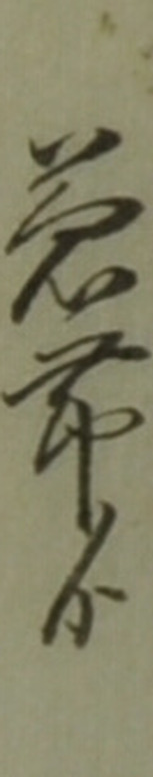兼帯ゟ

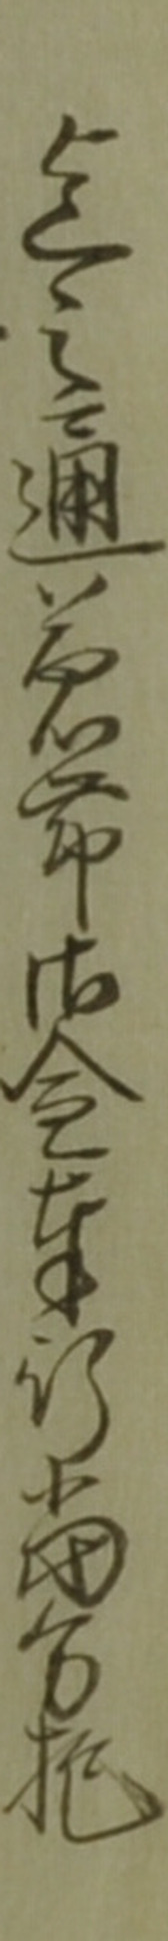迄之通兼帯御金奉行当分抱
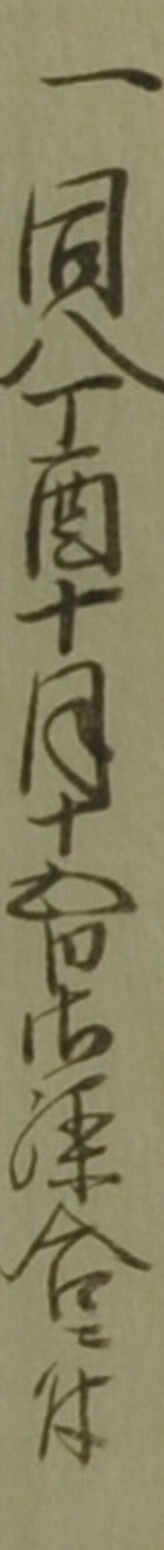一同八丁酉十月十五日御繰合ニ付
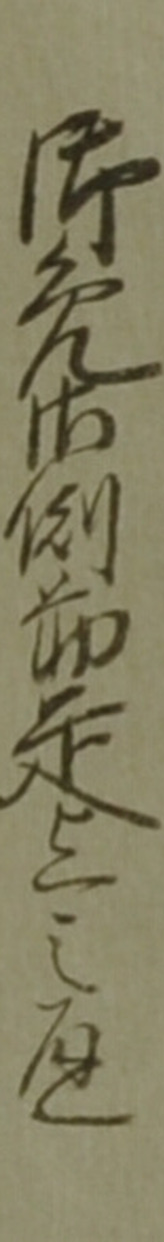御免御側勤是迄之通
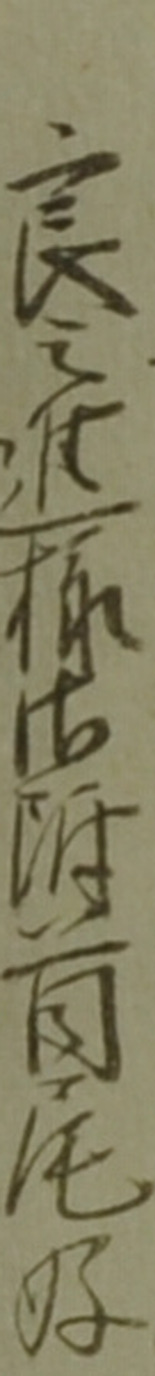良之進様御附首尾好
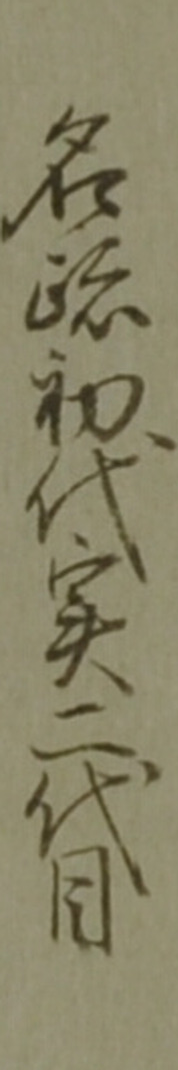名跡初代実二代目
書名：諸御役代々録（六）
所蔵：伊那市立高遠町図書館・合同会社AMANE
